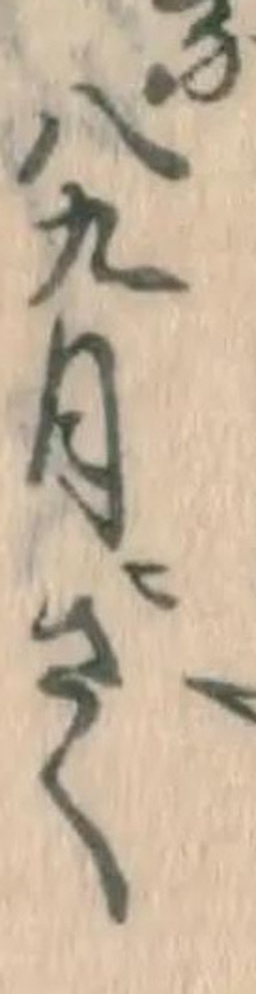八九月にさく
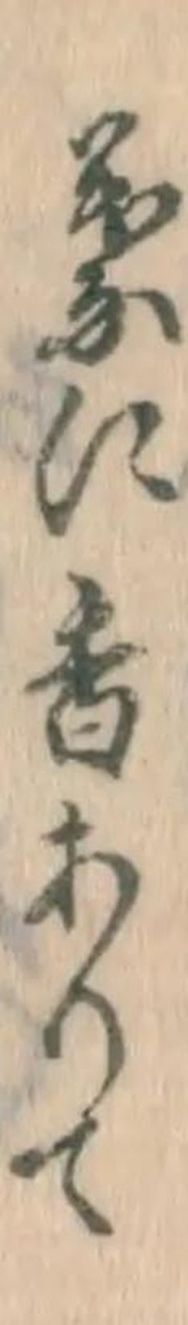葉に香ありて
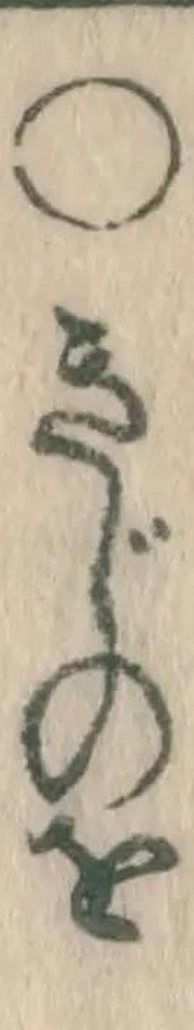〇きじのを
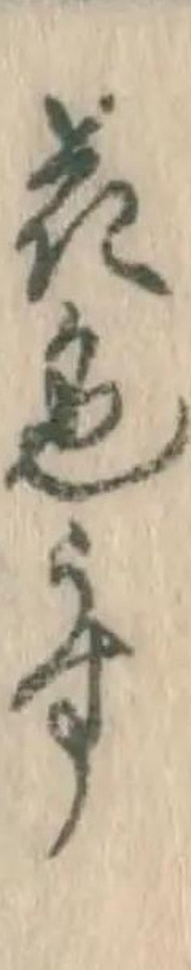花色うす
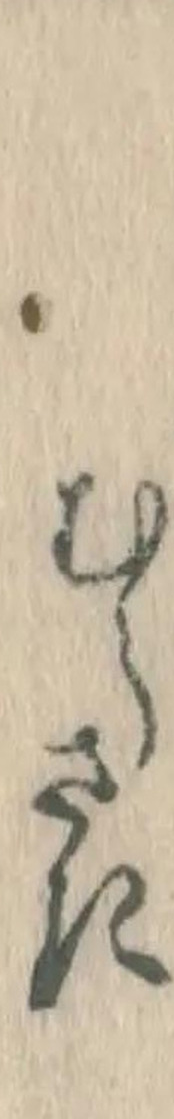むらさき
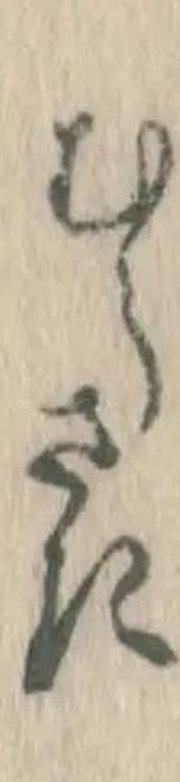むらさき
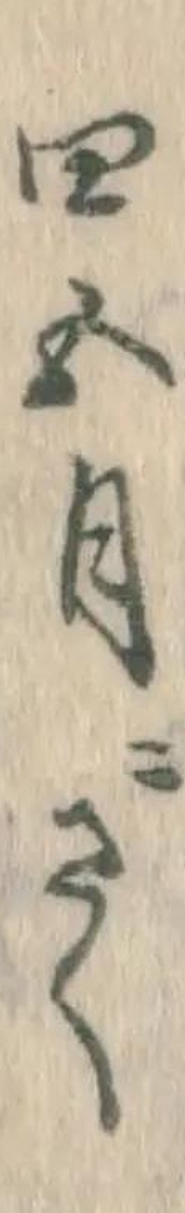四五月にさく

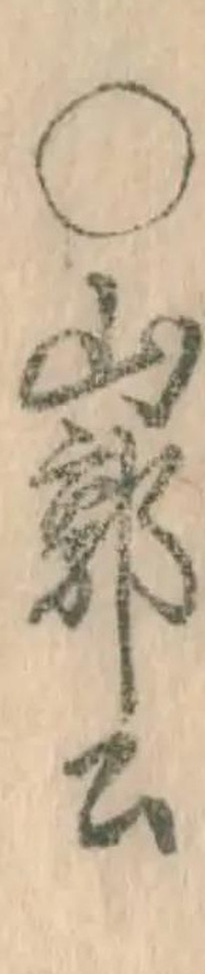〇山郭公
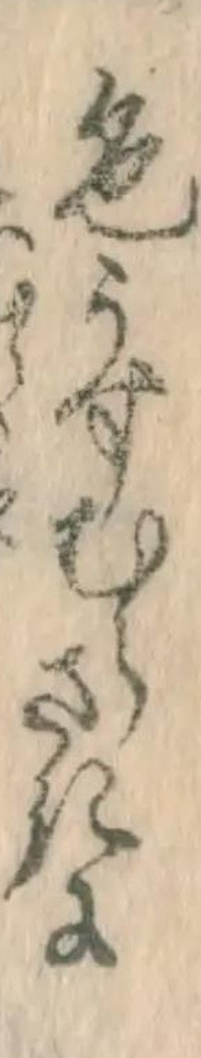色うすむらさきに
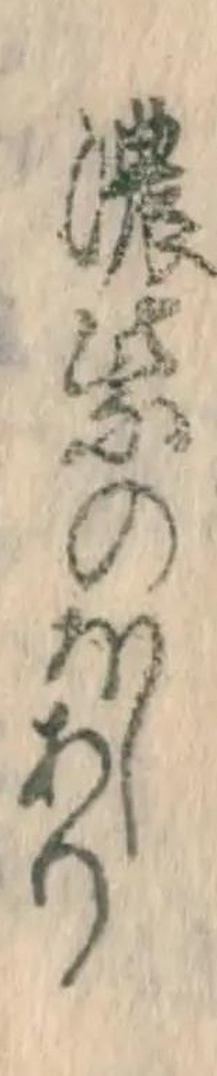濃紫のほしあり
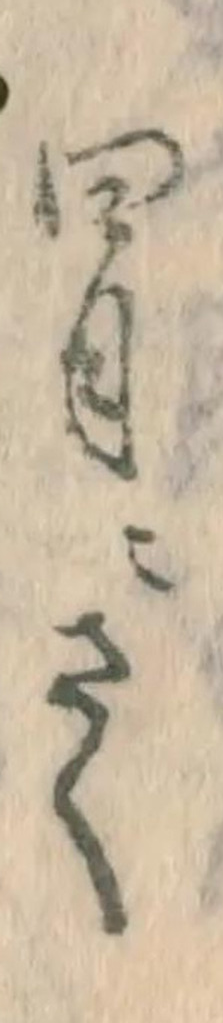四月にさく
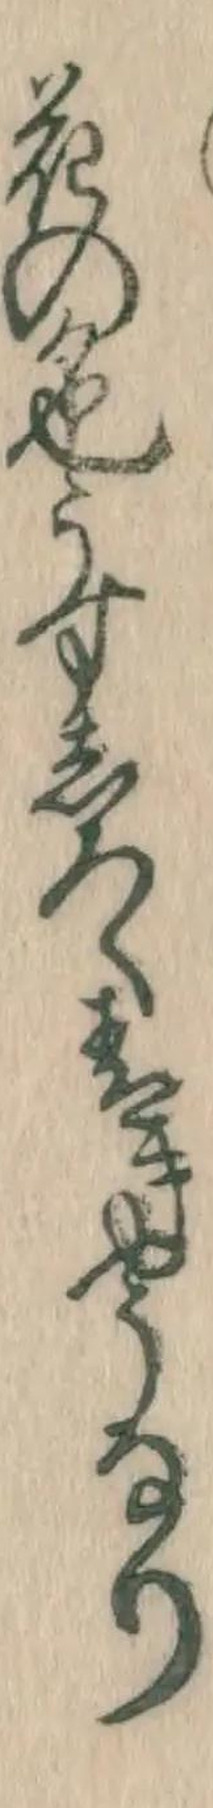花の色うすしろく青きやうなり
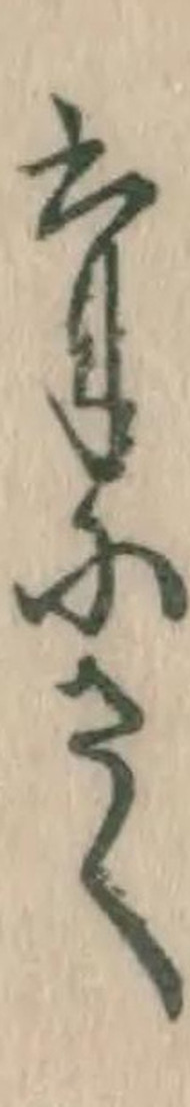六月にさく
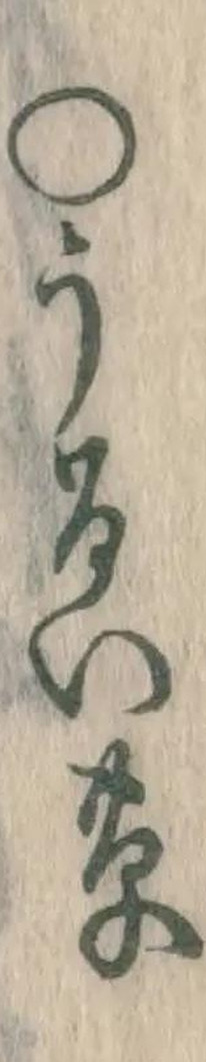〇うるい草
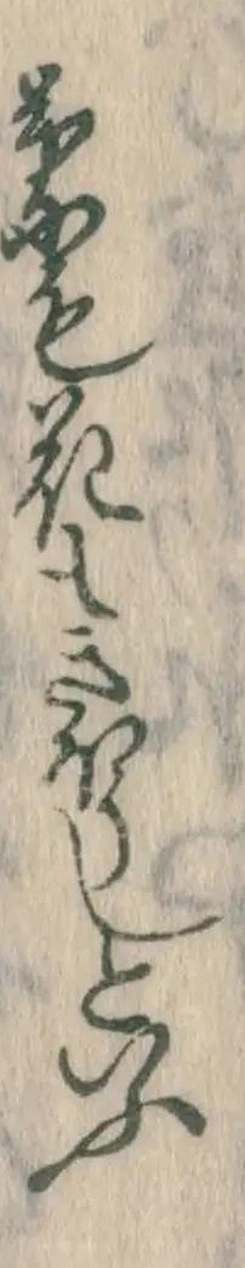草色もきほうしといふ
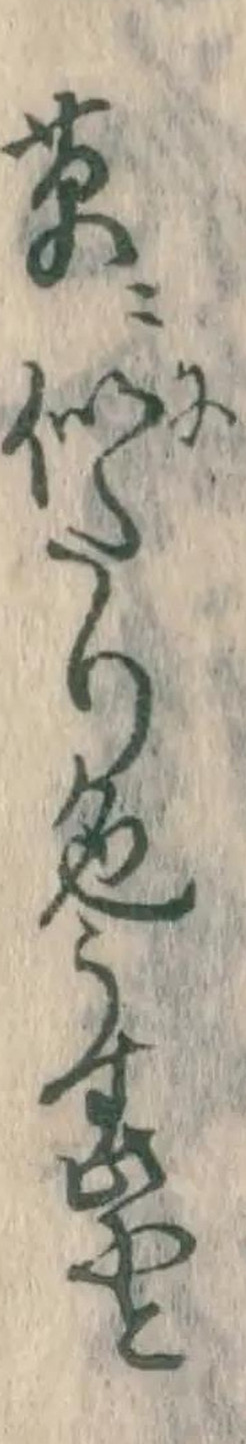草に似たり色うす紫と
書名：艸花繪前集. [3]
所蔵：国立国会図書館 National Diet Library, JAPAN
